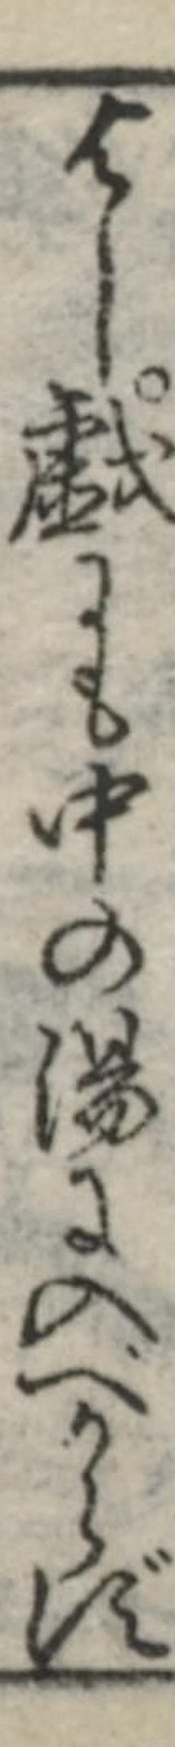よし。戯にも中の湯に入べからず。
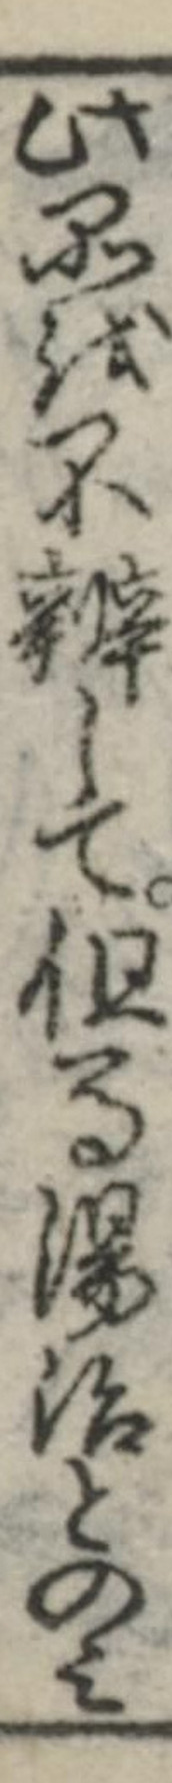此品を不弁して。但馬湯治とのみ
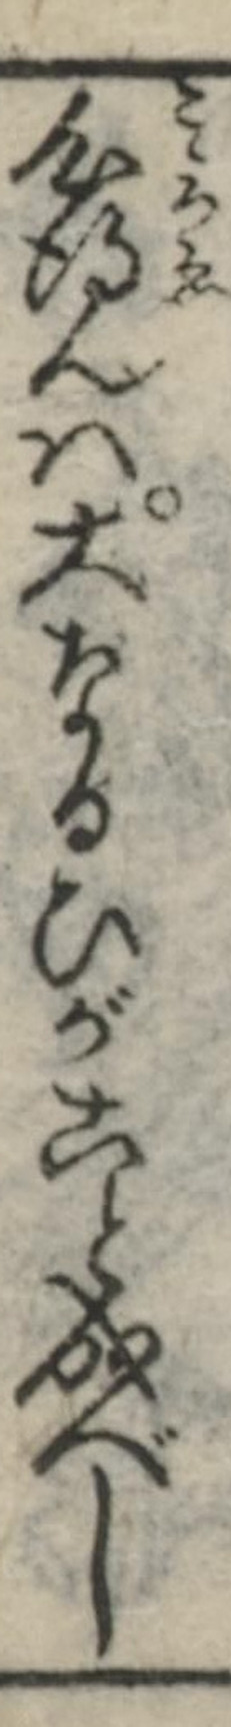心得んは。大なるひがこと成べし

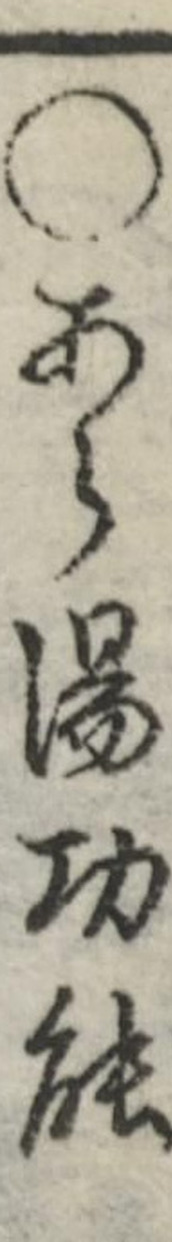◯あら湯功能
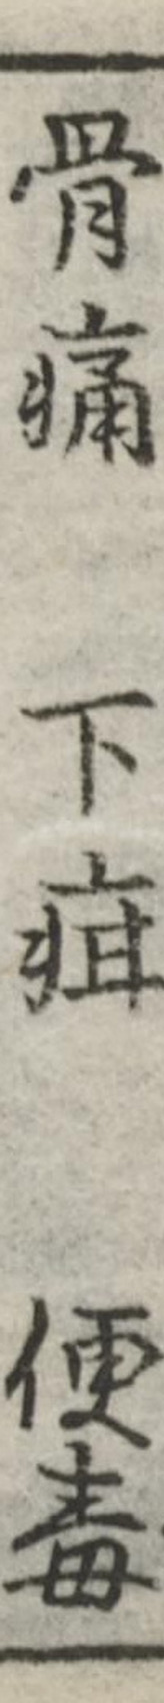骨痛下疳便毒
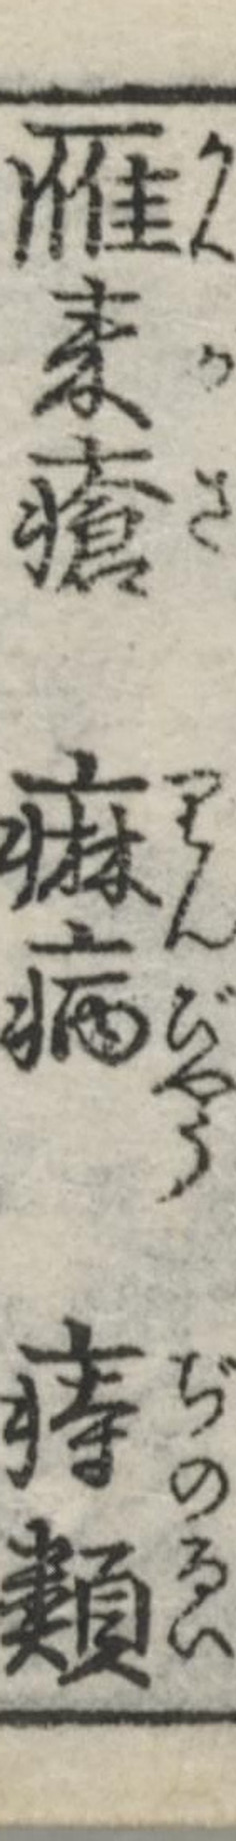雁来瘡痳病痔類
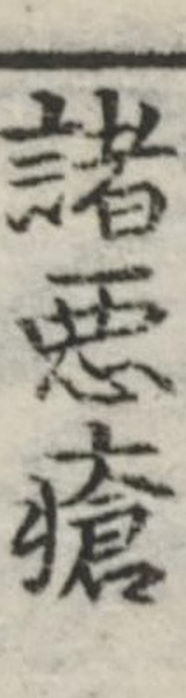諸悪瘡
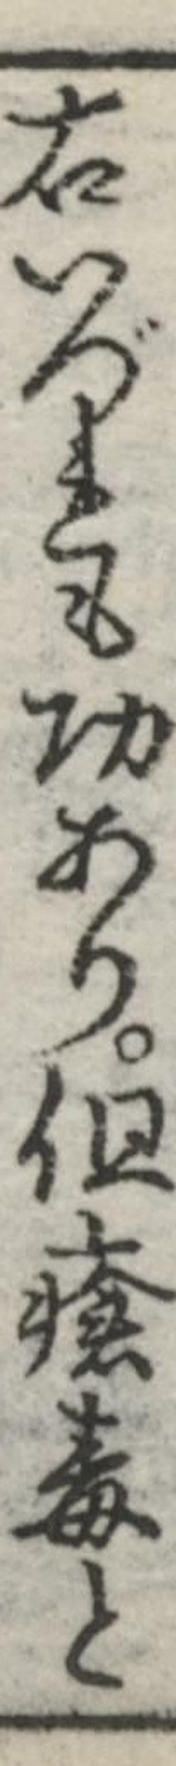右いづれも功あり。但瘡毒と
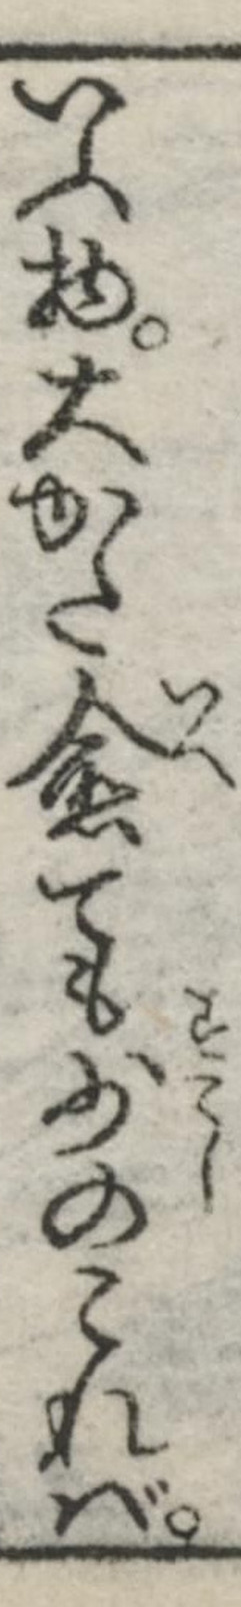いふ物。大かた愈ても少のこれば。
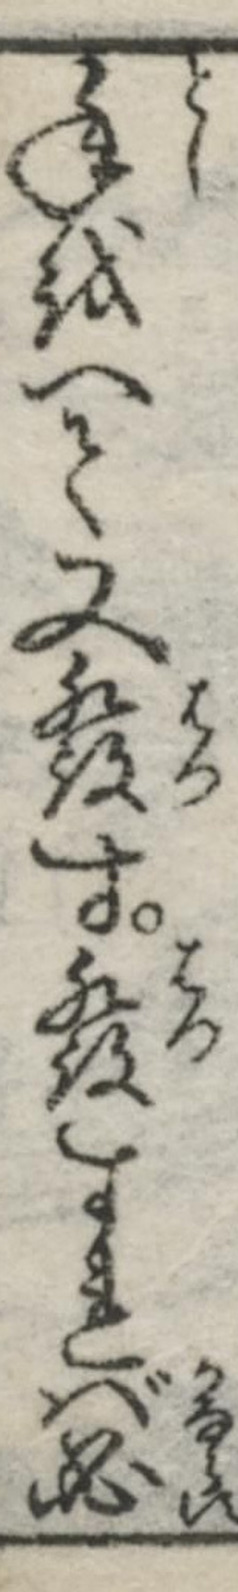年をへて又発す。発すれば必
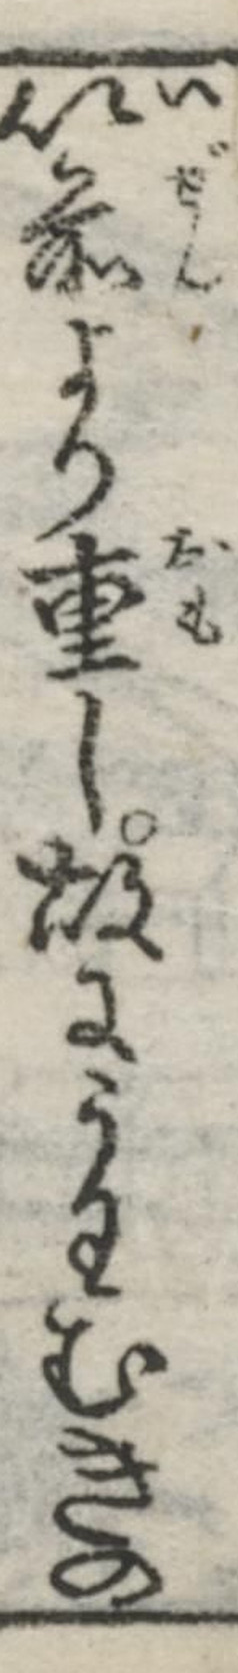以前より重し。故にうわむきの
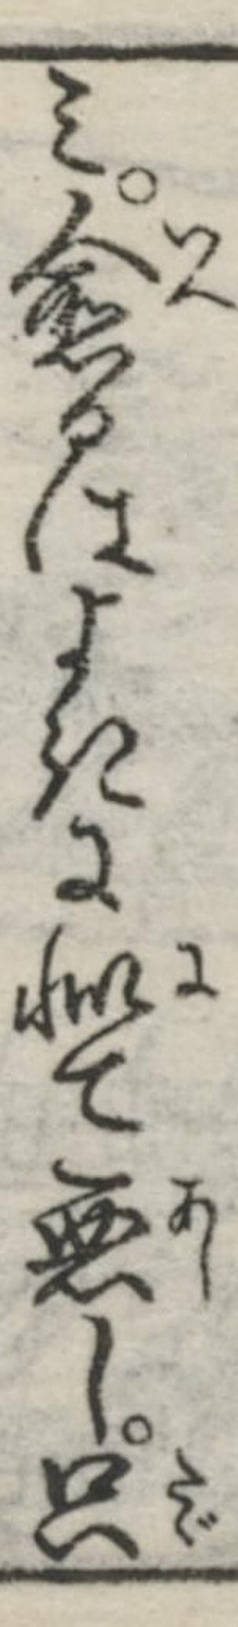み。愈るはよきに似て悪し。只
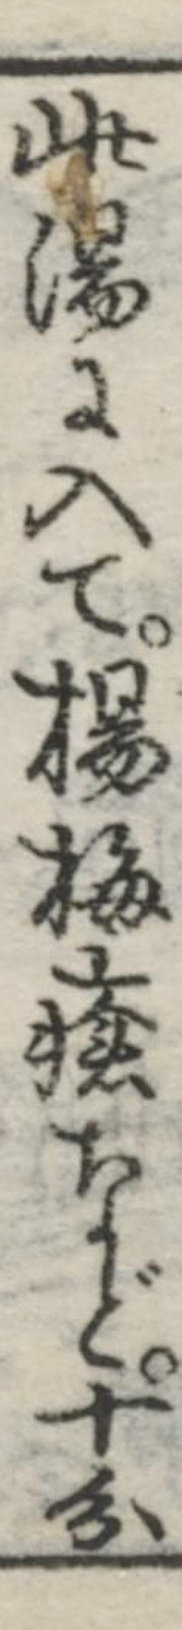此湯に入て。揚梅瘡など。十分
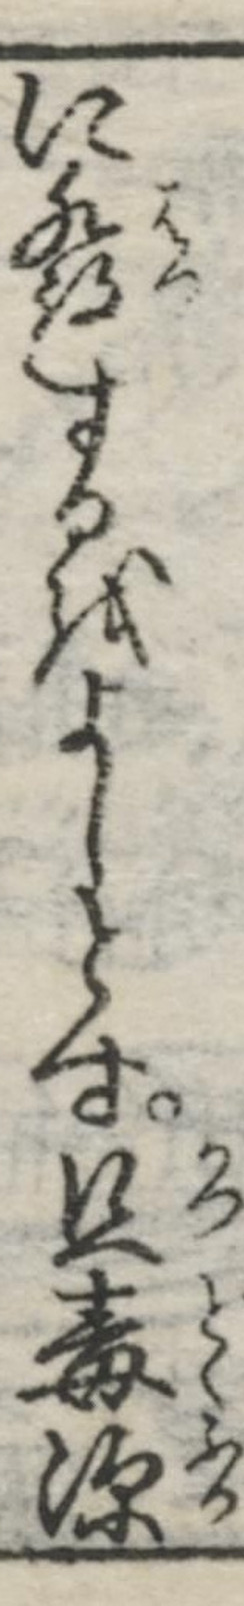に発するをよしとす。且毒深
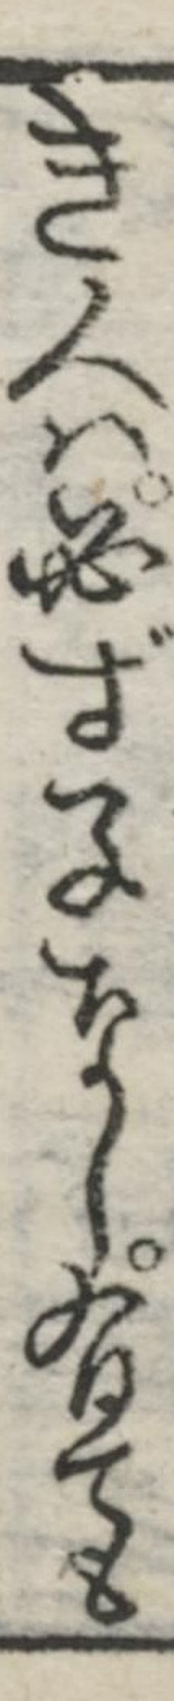き人は。必ず子なし。有ても
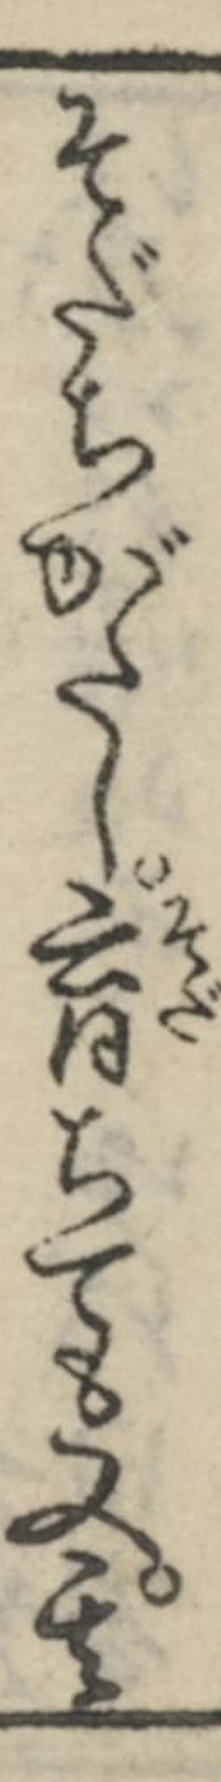そだちがたし。育ちても又。其
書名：但州城崎浴湯辧
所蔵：東京大学地震研究所図書室 Earthquake Research Institute Library, The University of Tokyo, JAPAN
